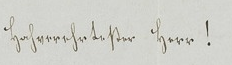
Hochverehrtester Herr!
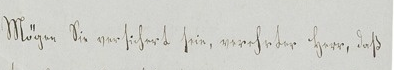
Mögen Sie versichert sein, verehrter Herr, daß
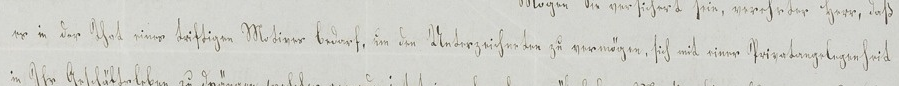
es in der That eines triftigen Motives bedarf, um den Unterzeichneten zu vermögen, sich mit einer Privatangelegenheit
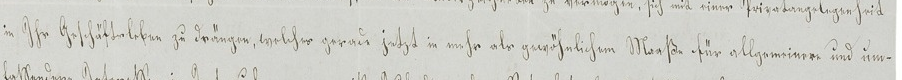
in Ihr Geschäftsleben zu drängen, welches gerade jetzt in mehr als gewöhnlichem Maaße für für allgemeinere und um-
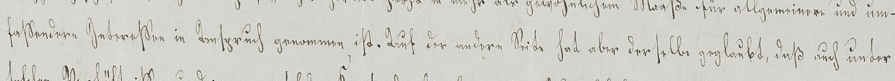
fassendere Interessen in Anspruch genommen ist. Auf der andern Seite hat aber derselbe geglaubt, daß auch unter
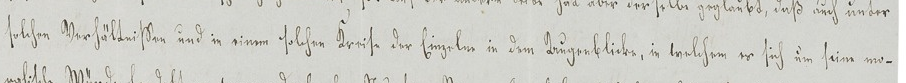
solchen Verhältnisen und in einem solchen Kreise der Einzelne in dem Augenblicke, in welchem es sich um seine mo-
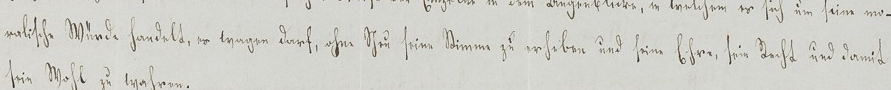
ralische Würde handelt, es wagen darf, ohne Scheu seine Stimme zu erheben und seine Ehre, sein Recht und damit
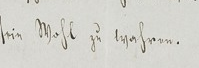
sein Wohl zu wahren.
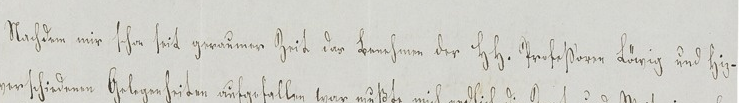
Nachdem mir schon seit geraumer Zeit das Benehmen der HH. Professoren Löwig und Hiz-
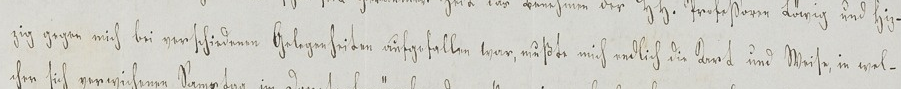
zig gegen mich bei verschiedenen Gelegenheiten aufgefallen war, mußte mich endlich die Art und Weise, in wel-
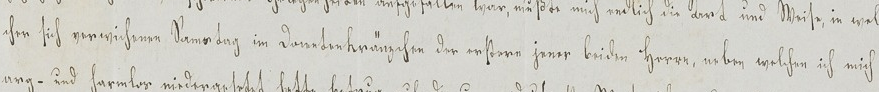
cher sich verwichenen Samstag im Docentenkränzchen der erstere jener beiden Herrn, neben welchen ich mich
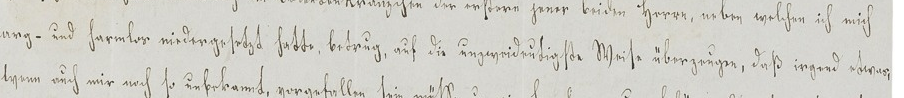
arg- und harmlos niedergesetzt hatte, betrug, auf die unzweideutigste Weise überzeugen, daß irgend etwas,
